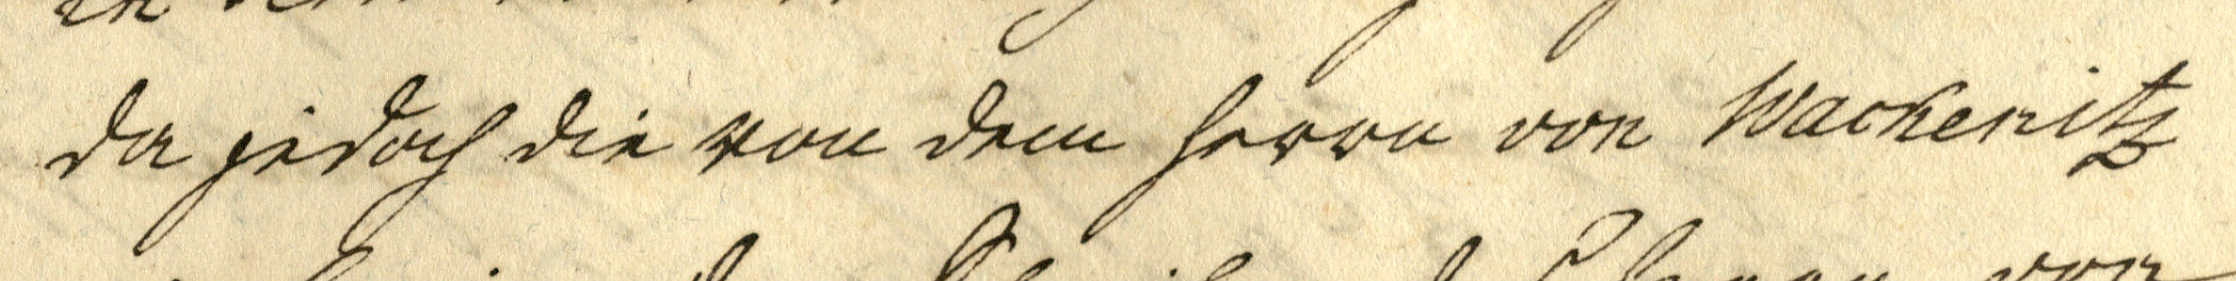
da jedoch die von dem Herrn von Wackenitz
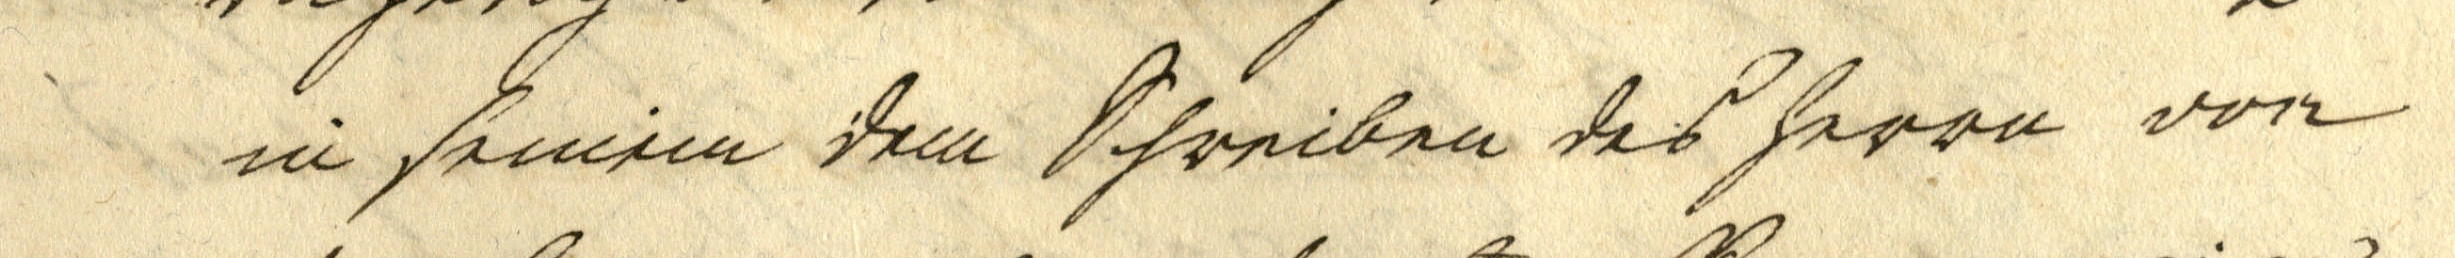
in seinem dem Schreiben des Herrn von
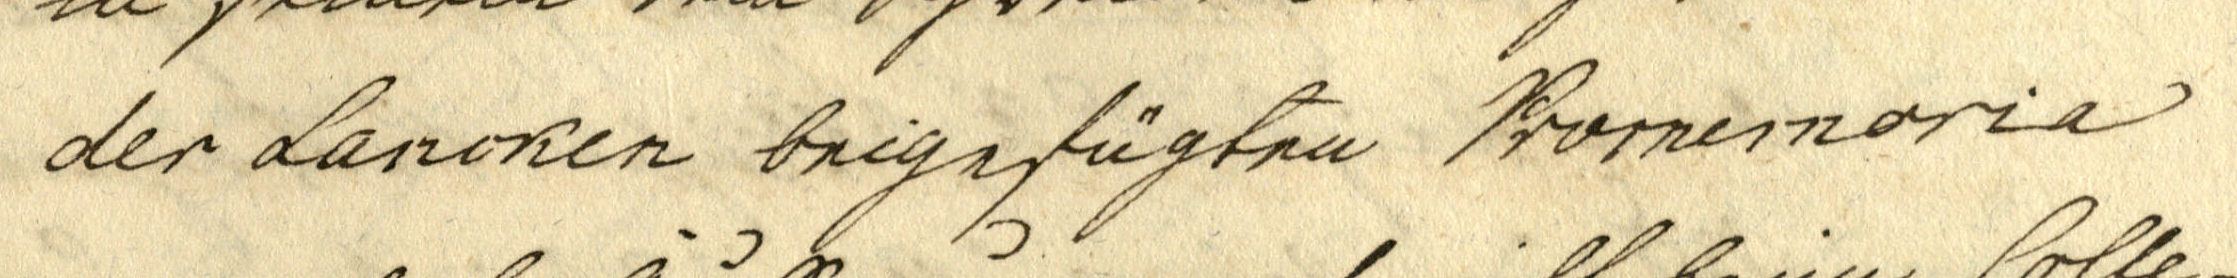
der Lancken beigefügten Promemoria
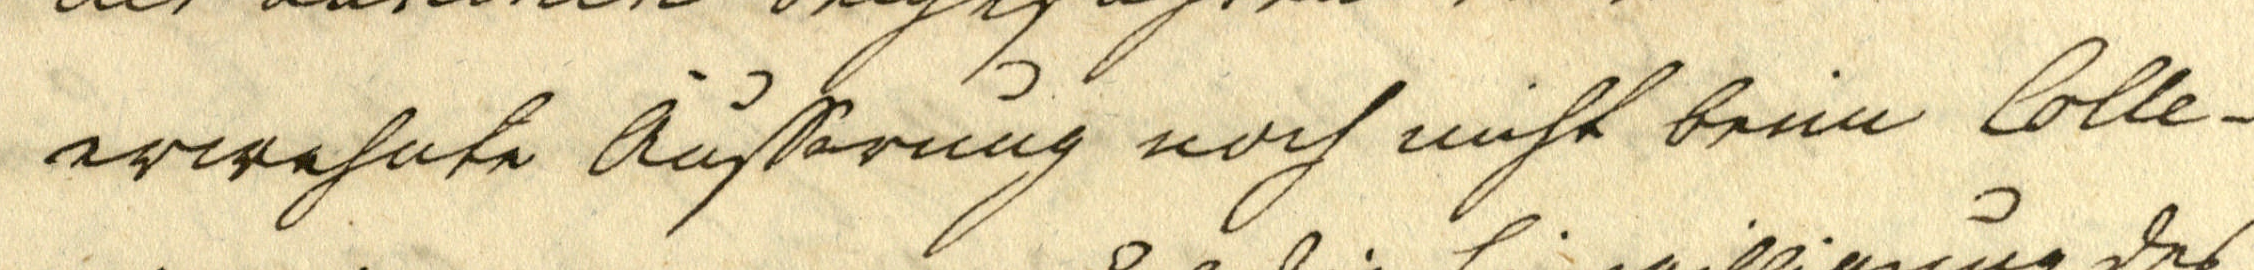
erwehnte Äusserung noch nicht beim Colle¬
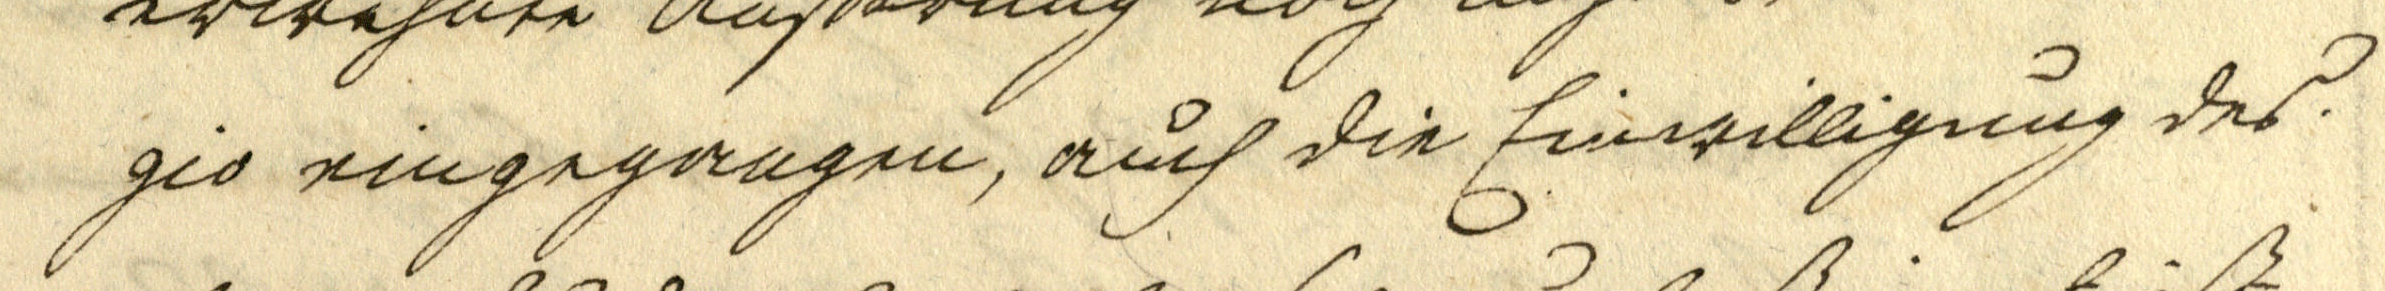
gio eingegangen, auch die Einwilligung des¬
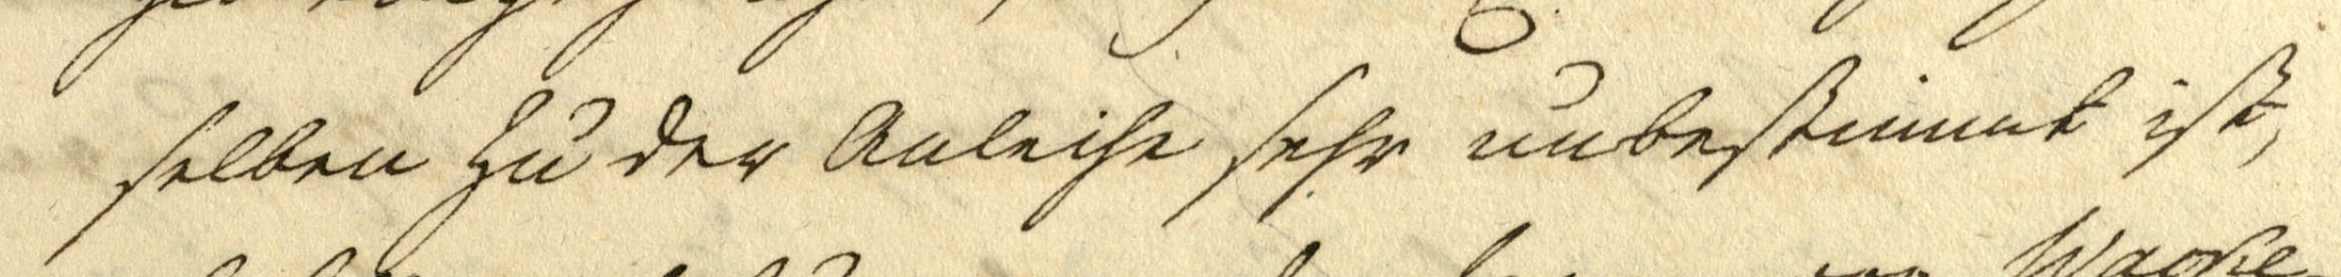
selben zu der Anleihe sehr unbestimmt ist,
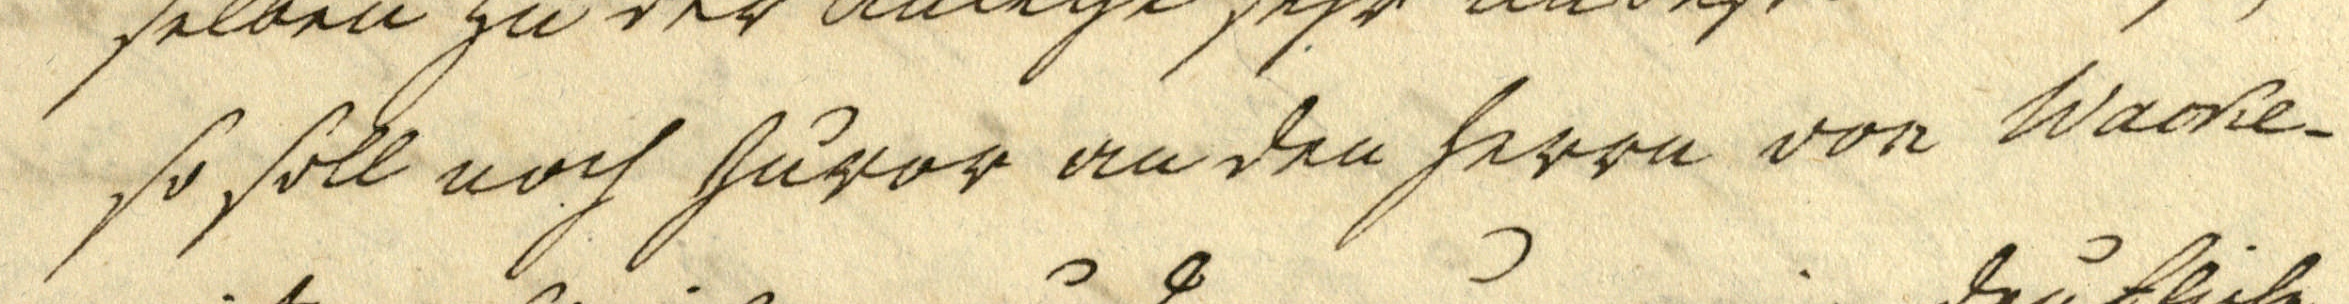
so soll noch zuvor an den Herrn von Wacke¬
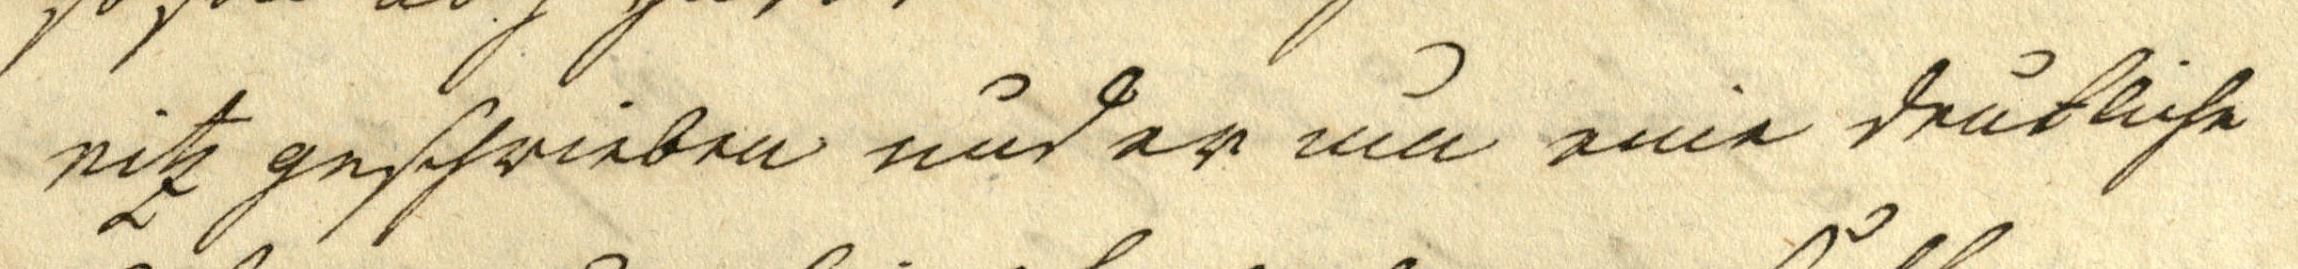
nitz geschrieben und er um eine deutliche
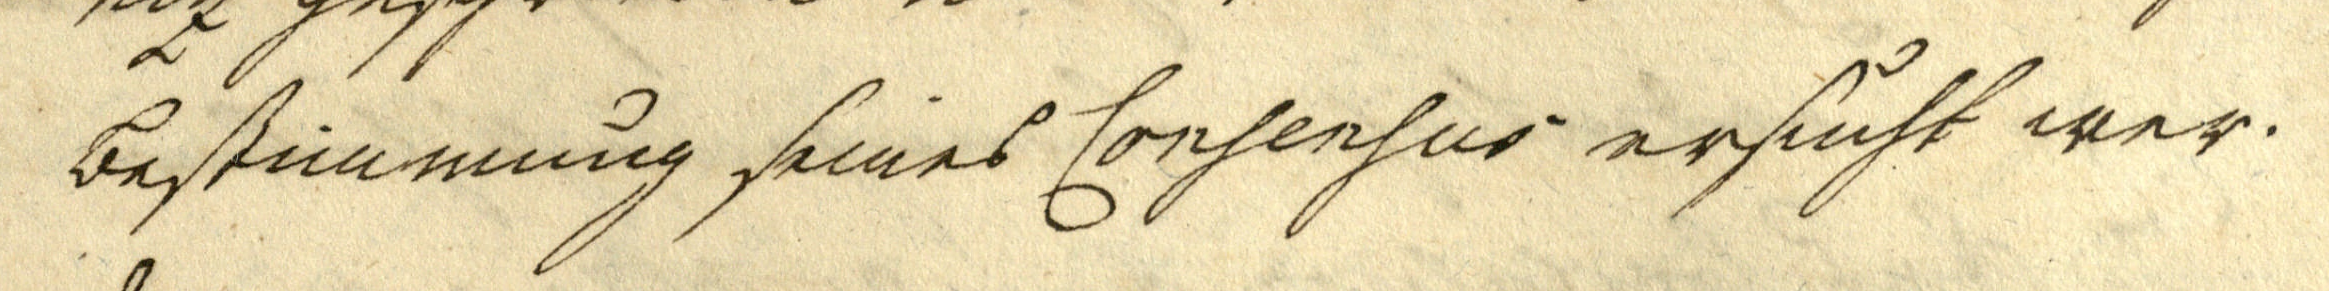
Bestimmung seines Consensus ersucht wer¬
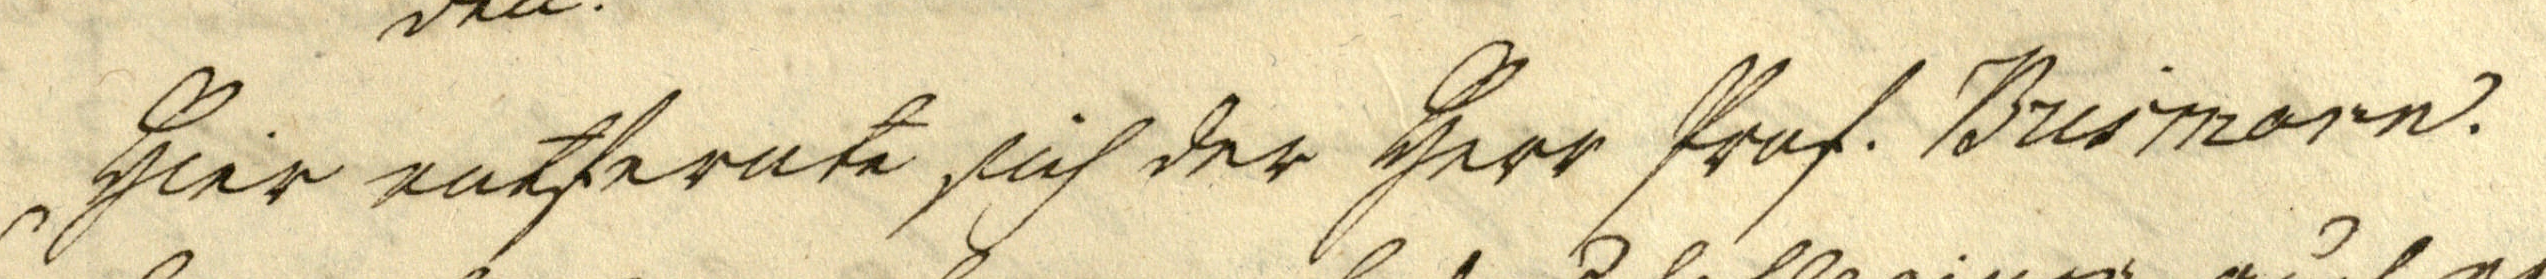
Hier entfernte sich der Herr Prof. Brismann.
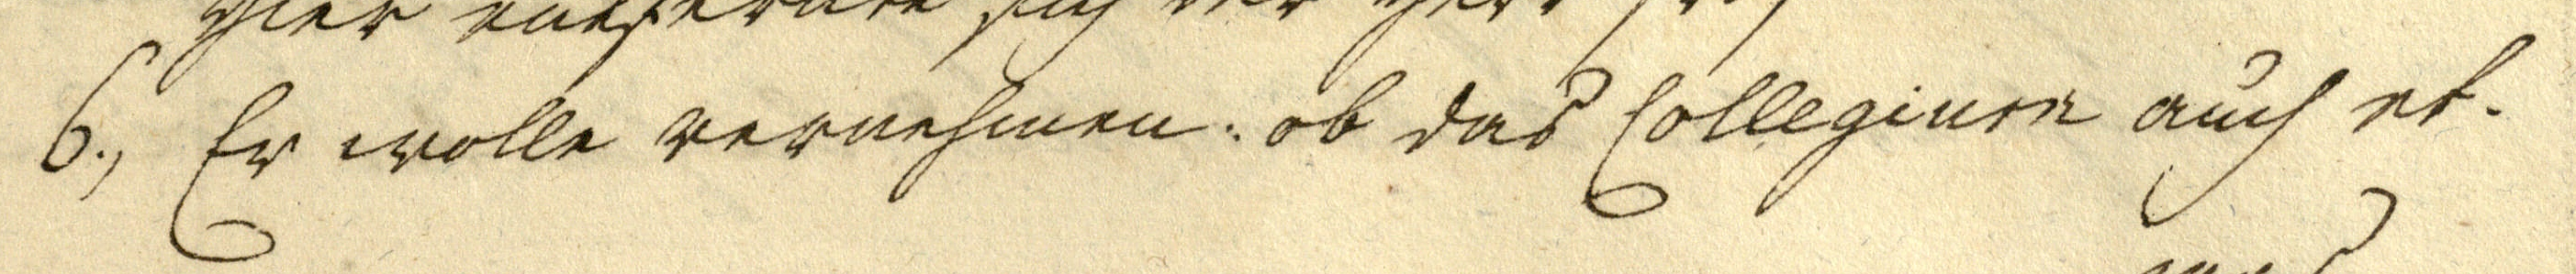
6., Er wolle vernehmen: ob das Collegium auch et¬
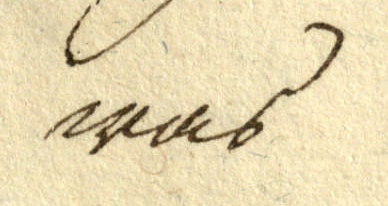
was
